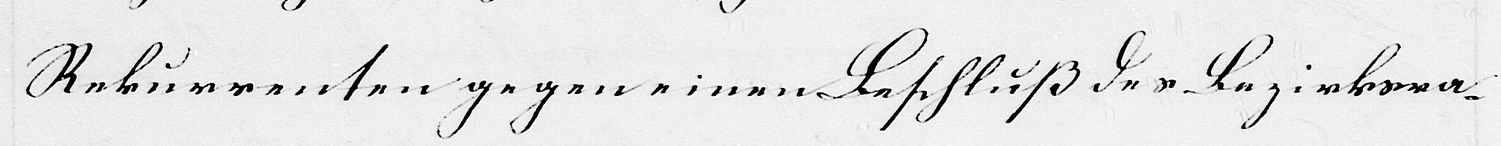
Rekurrenten gegen einen Beschluß des Bezirksra¬
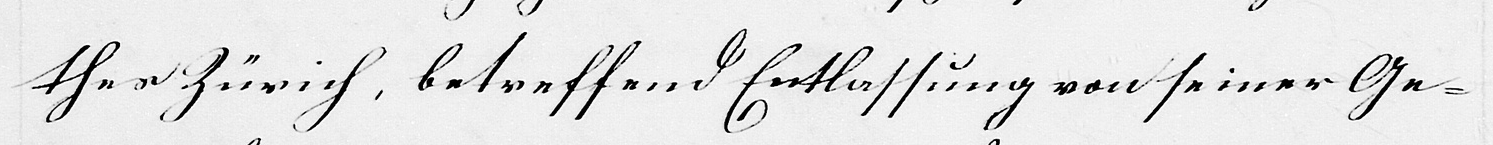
thes Zürich, betreffend Entlassung von seiner Ge¬
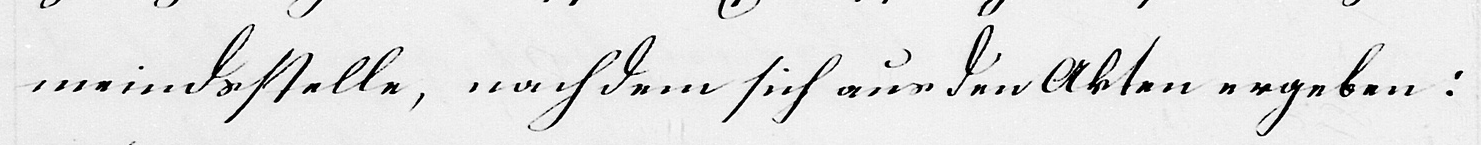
meindsstelle, nachdem sich aus den Akten ergeben:
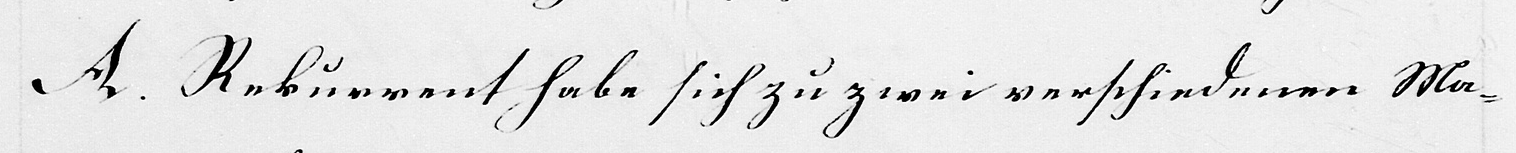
A. Rekurrent habe sich zu zwei verschiedenen Ma¬
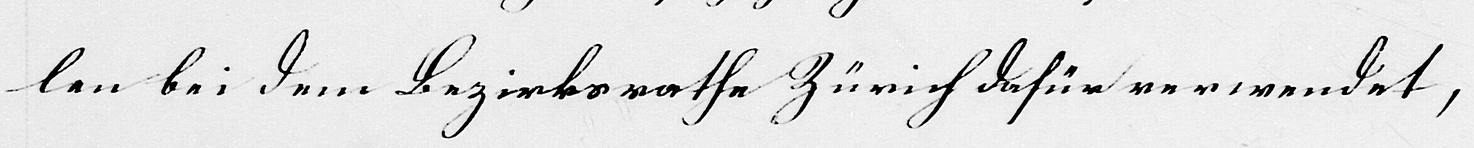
len bei dem Bezirksrathe Zürich dafür verwendet,
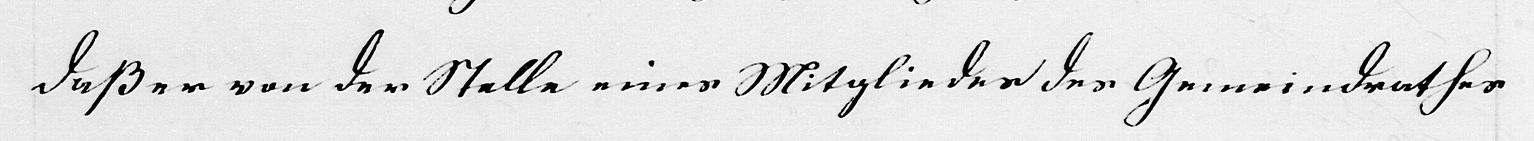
daß er von der Stelle eines Mitgliedes des Gemeindrathes
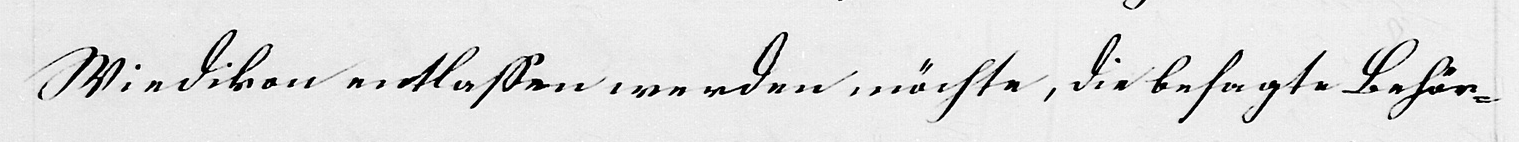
Wiedikon entlaßen werden möchte, die besagte Behör¬
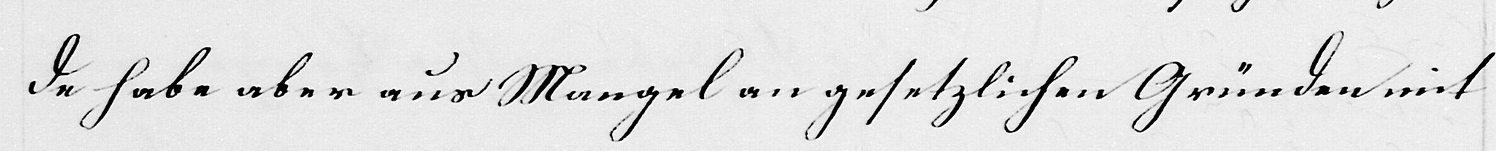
de habe aber aus Mangel an gesetzlichen Gründen mit
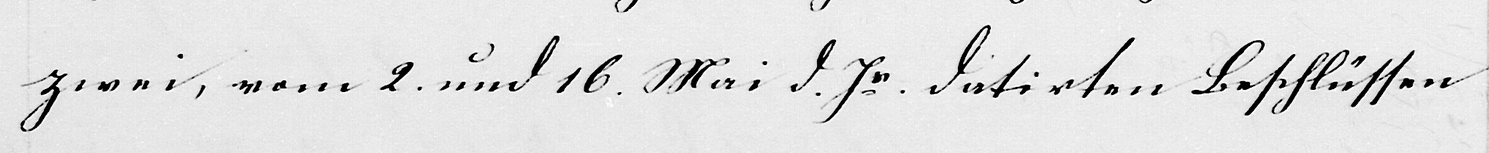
zwei, vom 2. und 16. Mai d. Js. datirten Beschlüssen
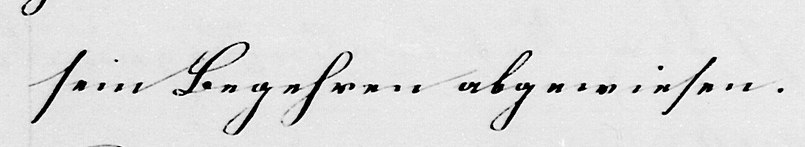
sein Begehren abgewiesen.
